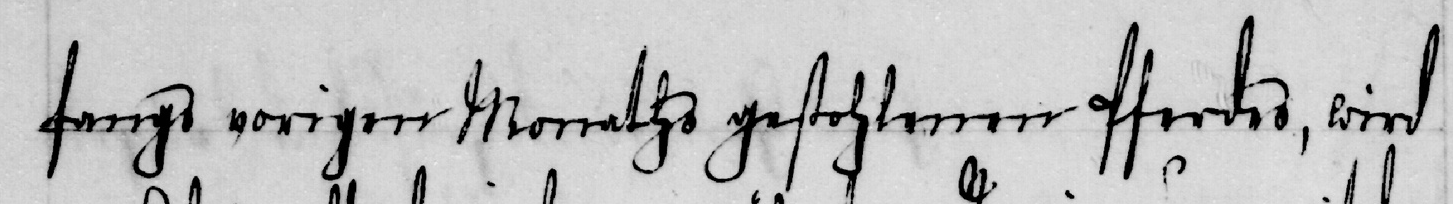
fangs vorigen Monaths gestohlenen Pferdes, wird
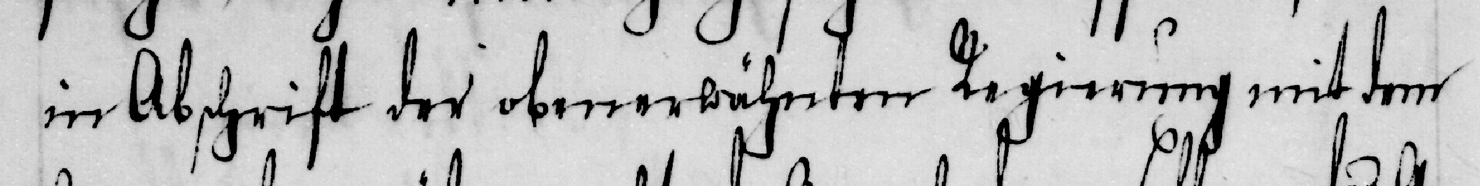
in Abschrift der obenerwähnten Regierung mit dem
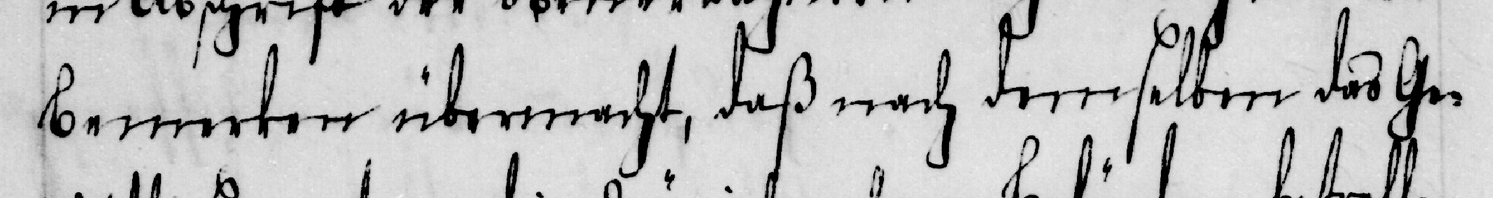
Bemerken übermacht, daß nach demselben das Ge¬
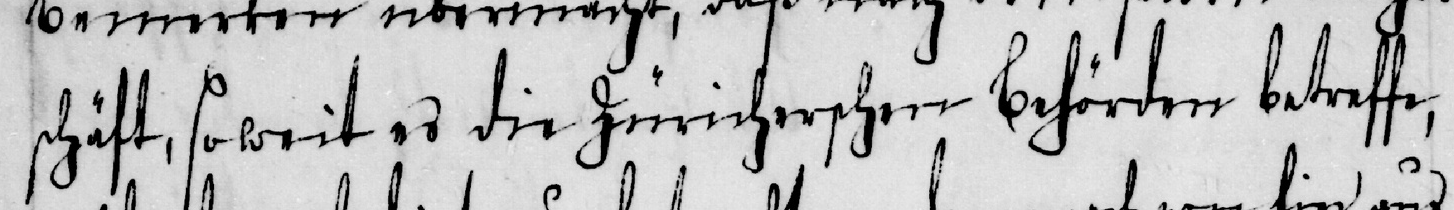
schäft, soweit es die Zürcherschen Behörden betreff¬
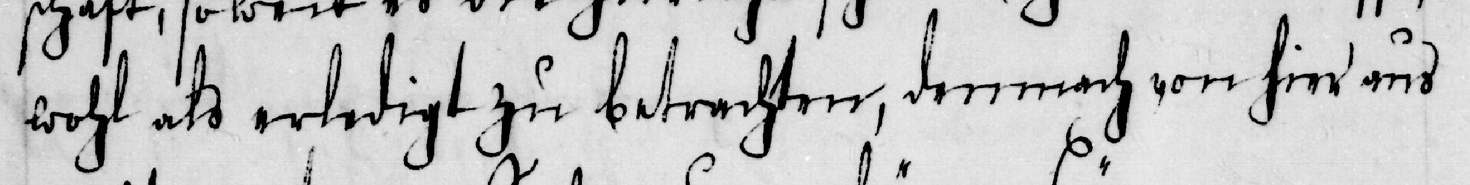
wohl als erledigt zu betrachten, demnach von hier aus
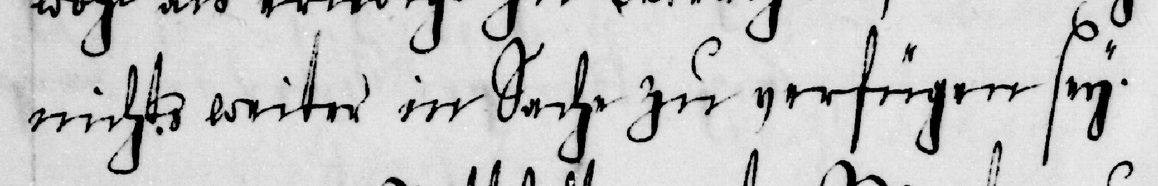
nichts weiter in Sache zu verfügen sey.
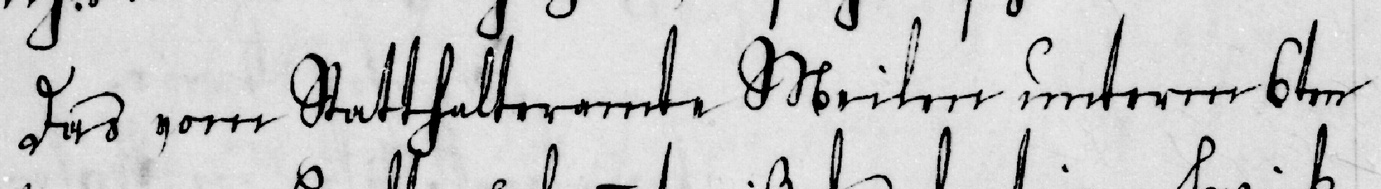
Das vom Statthalteramte Meilen unterm 6ten
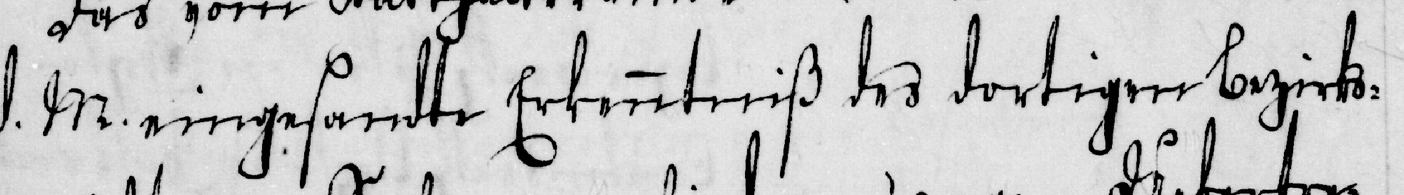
M. eingesandte Erkenntniß des dortigen Bezirks¬
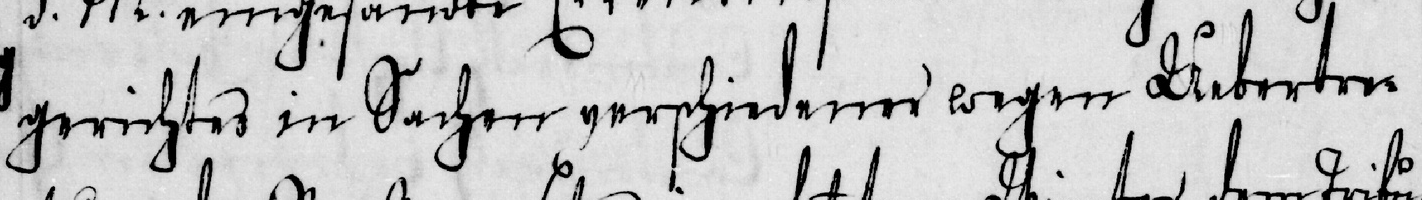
gerichtes in Sachen verschiedener wegen Uebertre¬
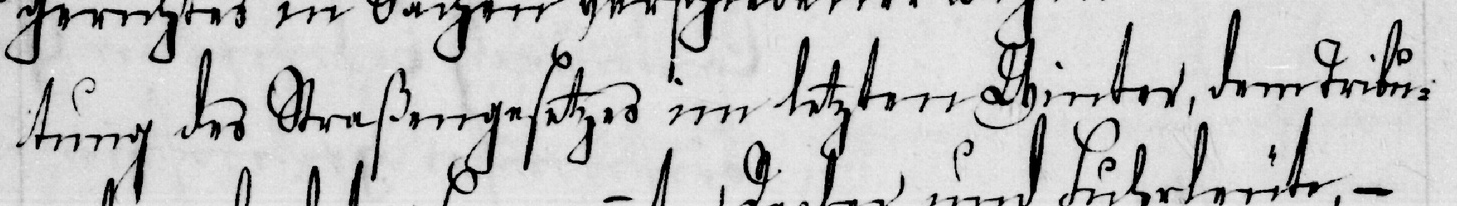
tung des Straßengesetzes im letzten Winter, dem Tribu¬
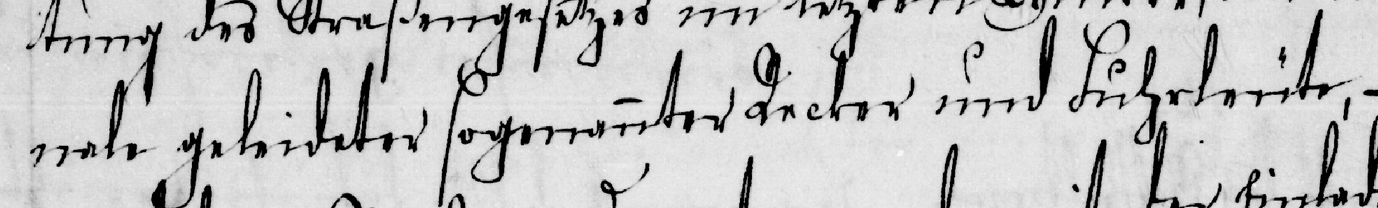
nale geleideter sogenannter Recker und Fuhrleute,
